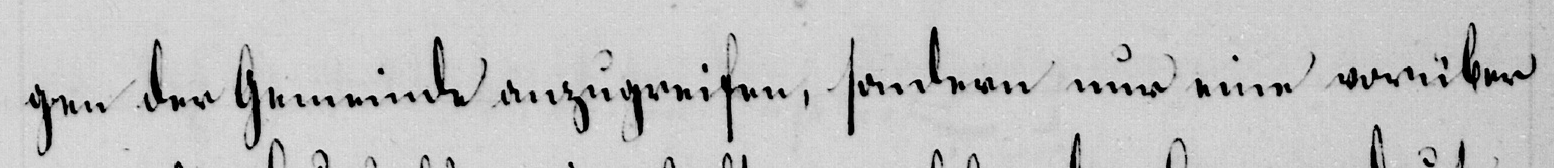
gen der Gemeinde anzugreifen, sondern nur eine vorüber
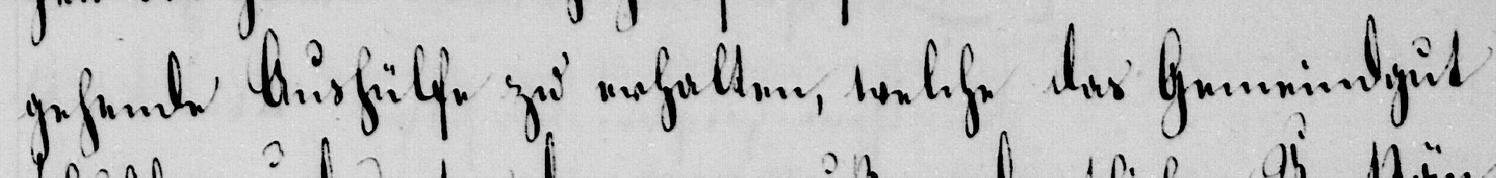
gehende Aushülfe zu erhalten, welche das Gemeindgut
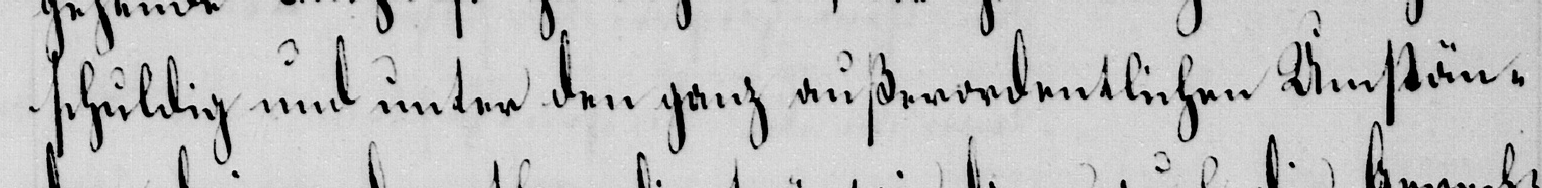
schuldig und unter den ganz außerordentlichen Umstän¬
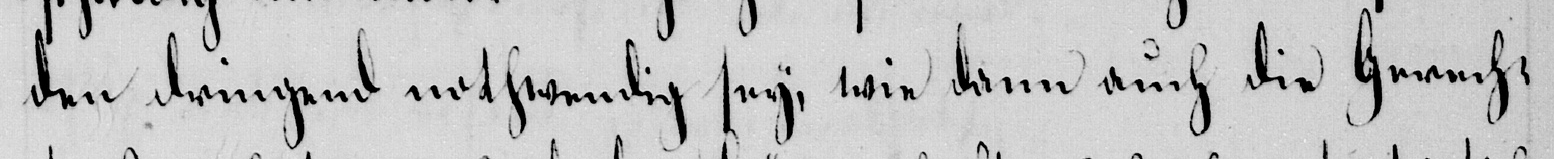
den dringend nothwendig sey, wie dann auch die Gerech¬
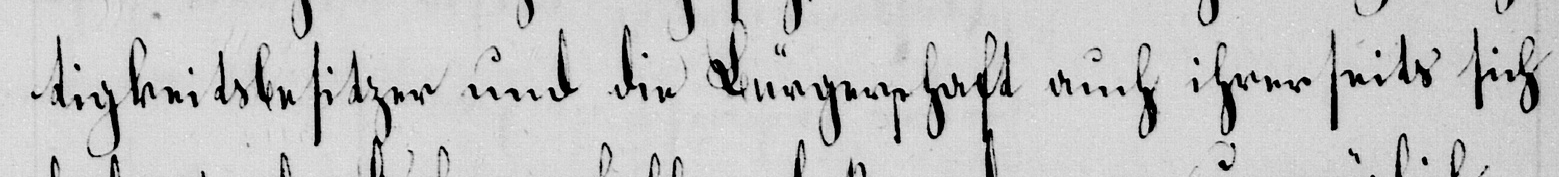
tigkeitsbesitzer und die Bürgerschaft auch ihrerseits sich
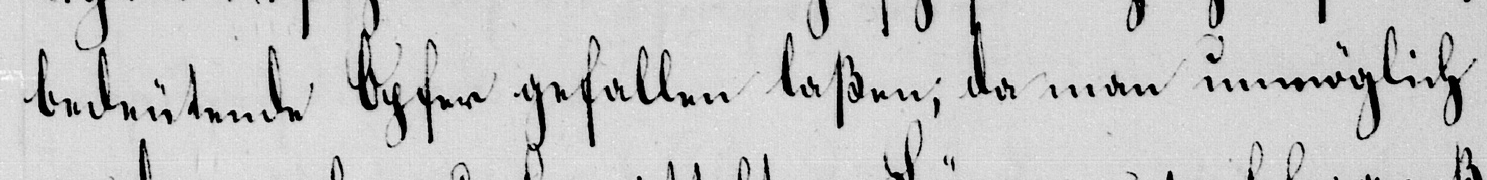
bedeutende Opfer gefallen laßen, da man unmöglich
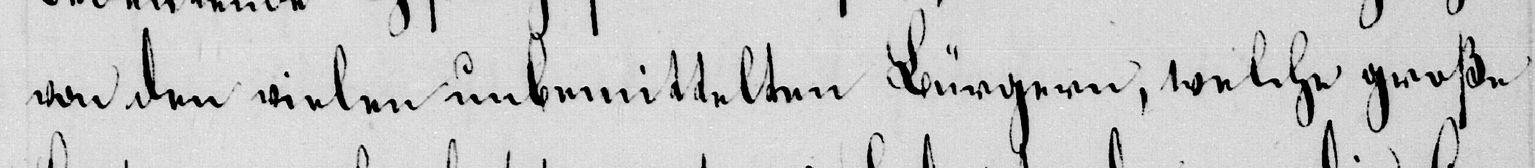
von den vielen unbemittelten Bürgern, welche große
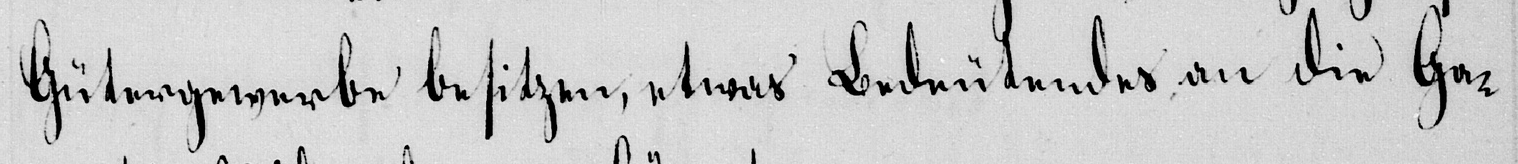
Gütergewerbe besitzen, etwas Bedeutendes an die Ga¬
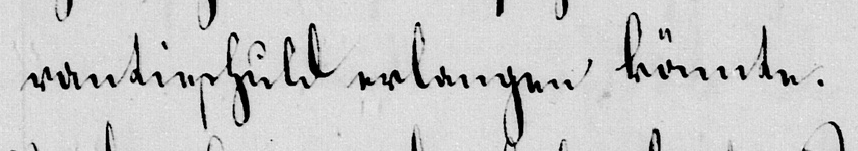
rantieschuld erlangen könnte.
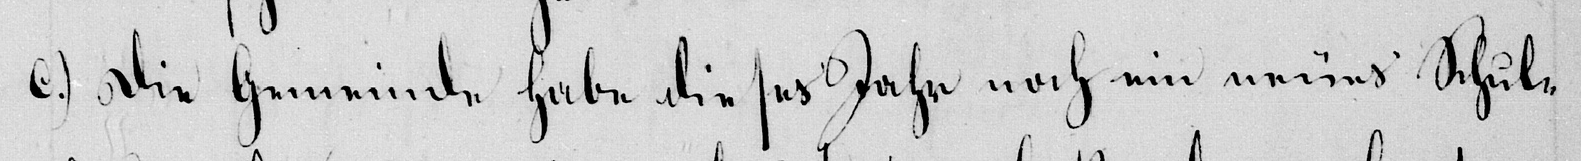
c.) Die Gemeinde habe dieses Jahr noch ein neues Schul¬
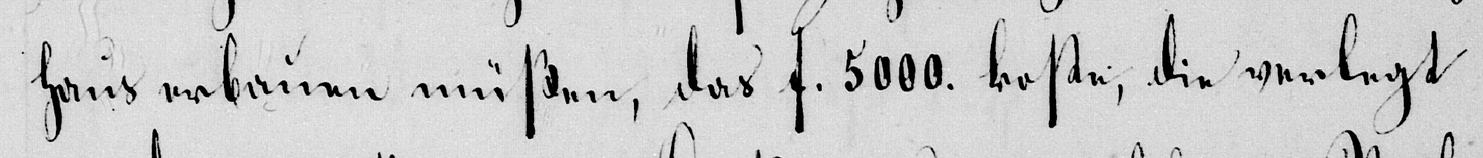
haus erbauen müßen, das f. 5000. koste, die verlegt
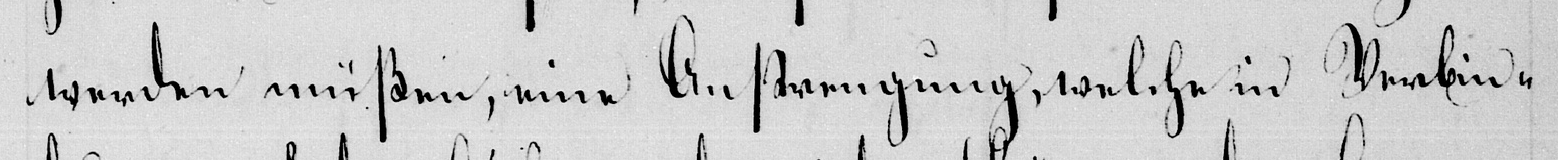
werden müßen, eine Anstrengung, welche in Verbin¬
